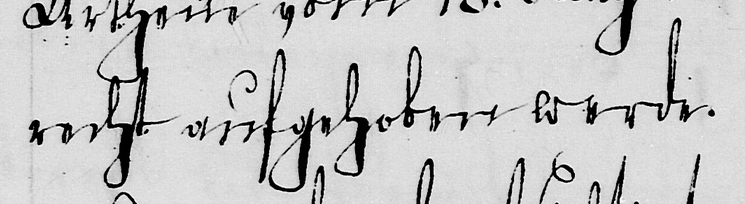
recht aufgehoben werde.
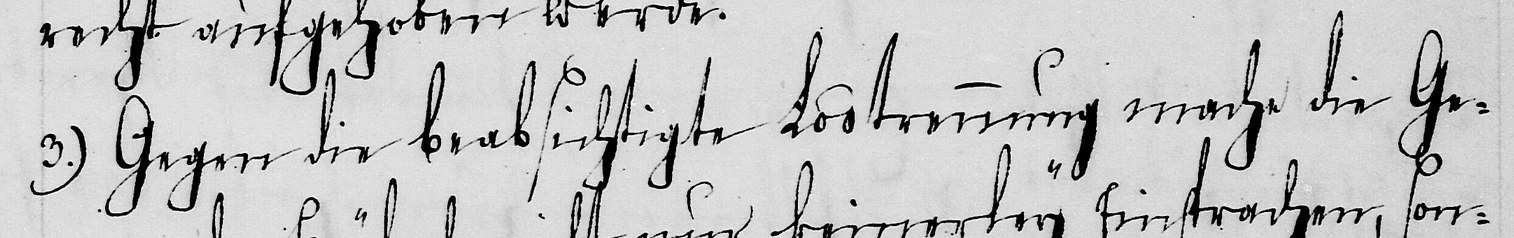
3.) Gegen die beabsichtigte Lostrennung mache die Ge¬
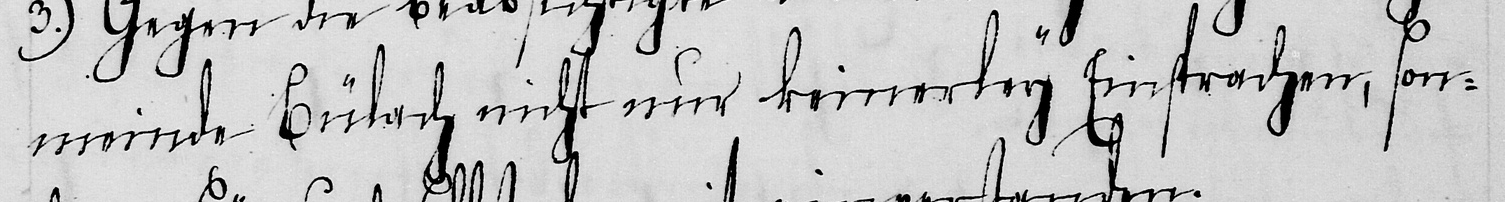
meinde Bülach nicht nur keinerley Einsprachen, son¬
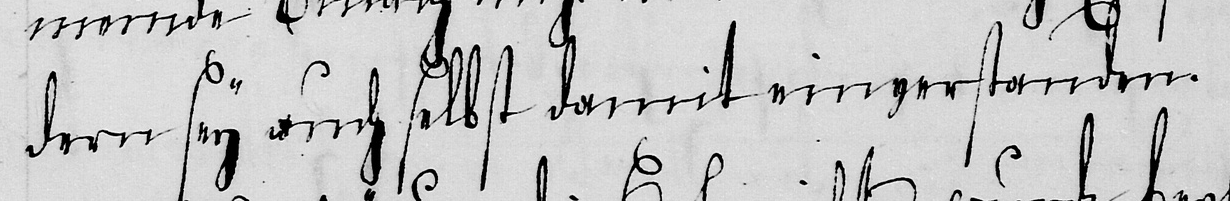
dern sey auch selbst damit einverstanden.
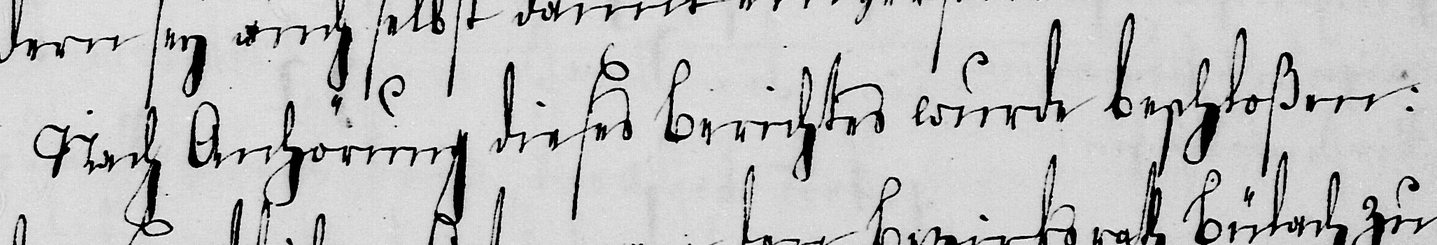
Nach Anhörung dieses Berichtes wurde beschloßen:
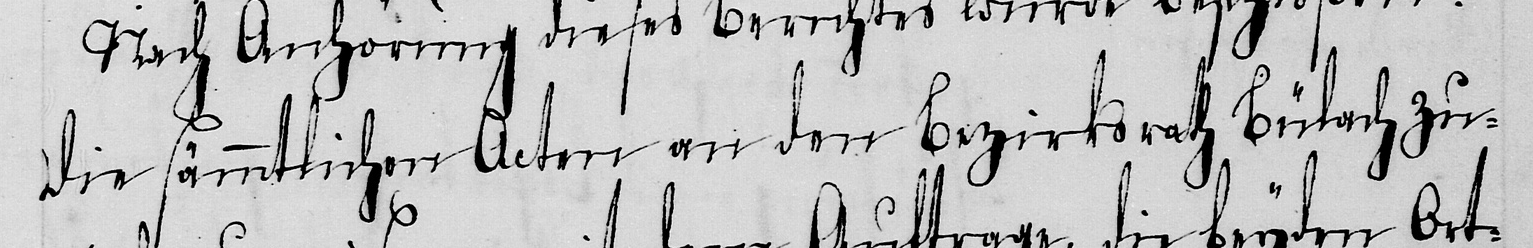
die sämmtlichen Acten an den Bezirksrath Bülach zu¬
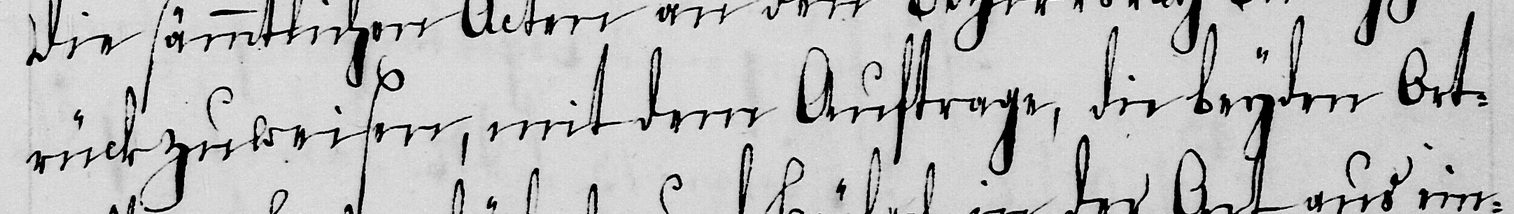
rückzuweisen, mit dem Auftrage, die beyden Ort¬
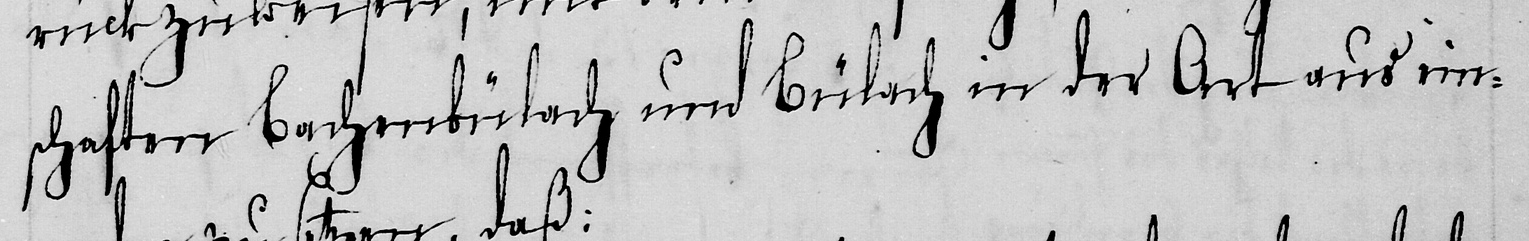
schaften Bachenbülach und Bülach in der Art ausein¬
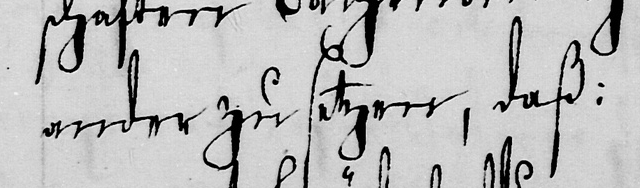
ander zu setzen, daß:
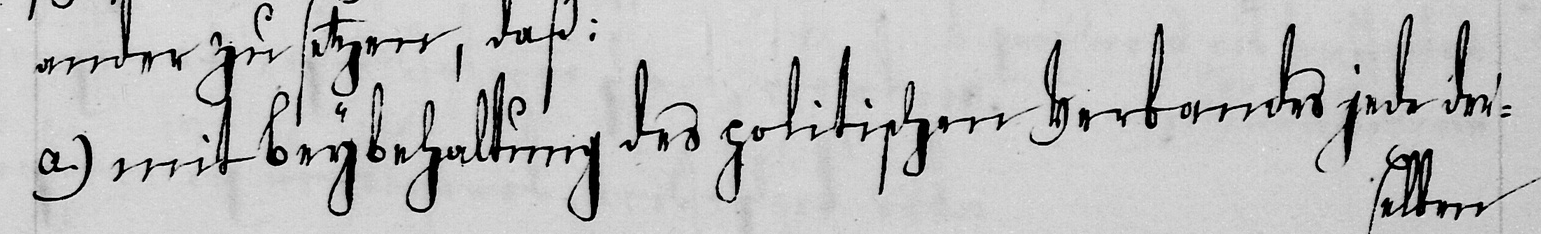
a.) mit Beybehaltung des politischen Verbandes jede
